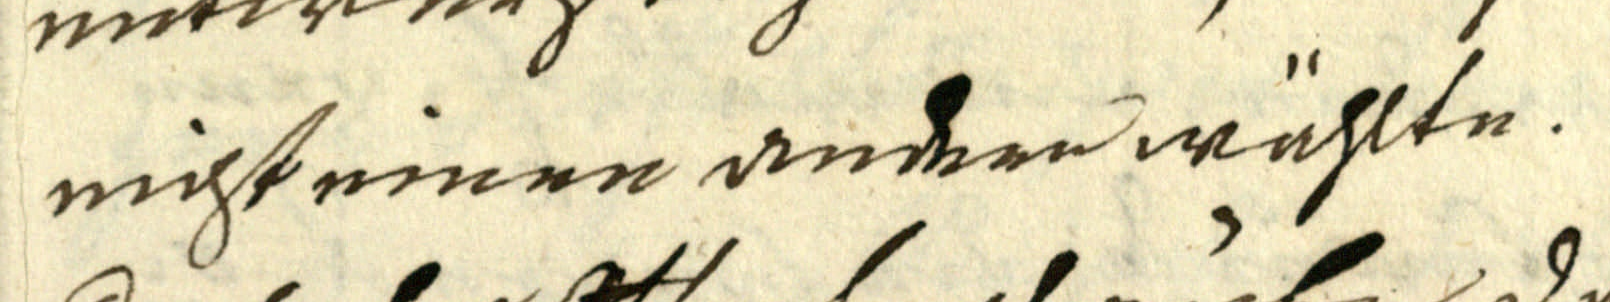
nicht einen andern wählte.
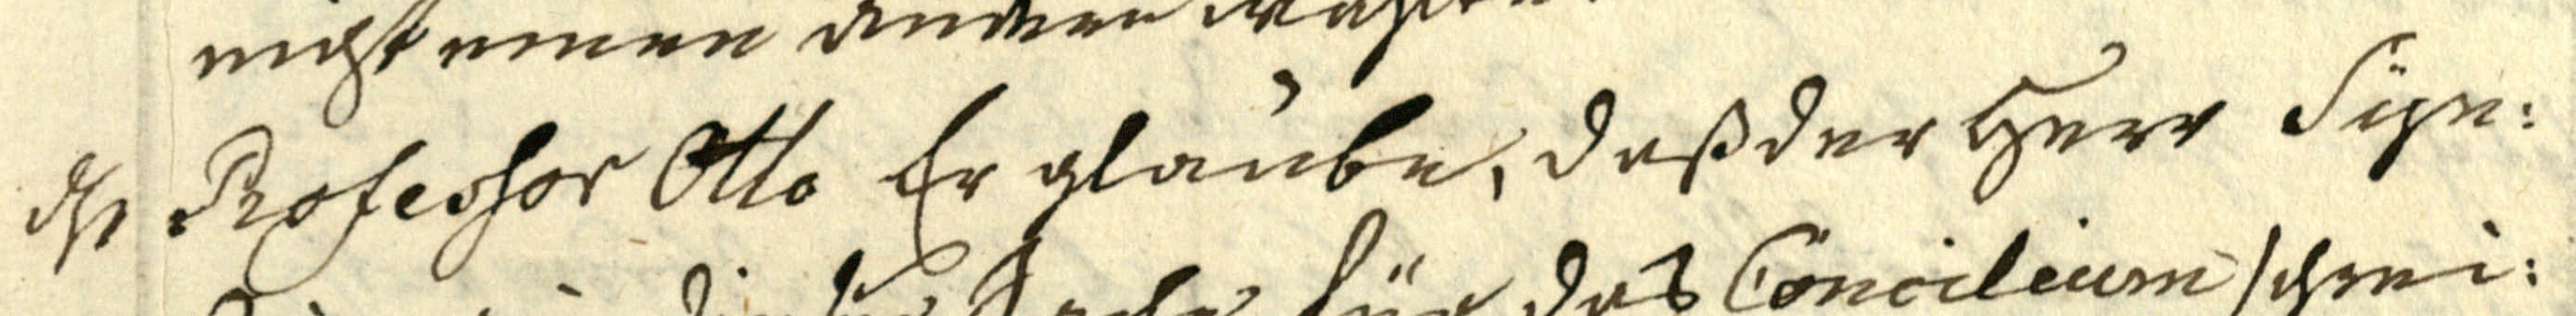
dh Professor Otto Er glaube, daß der Herr Sÿn¬
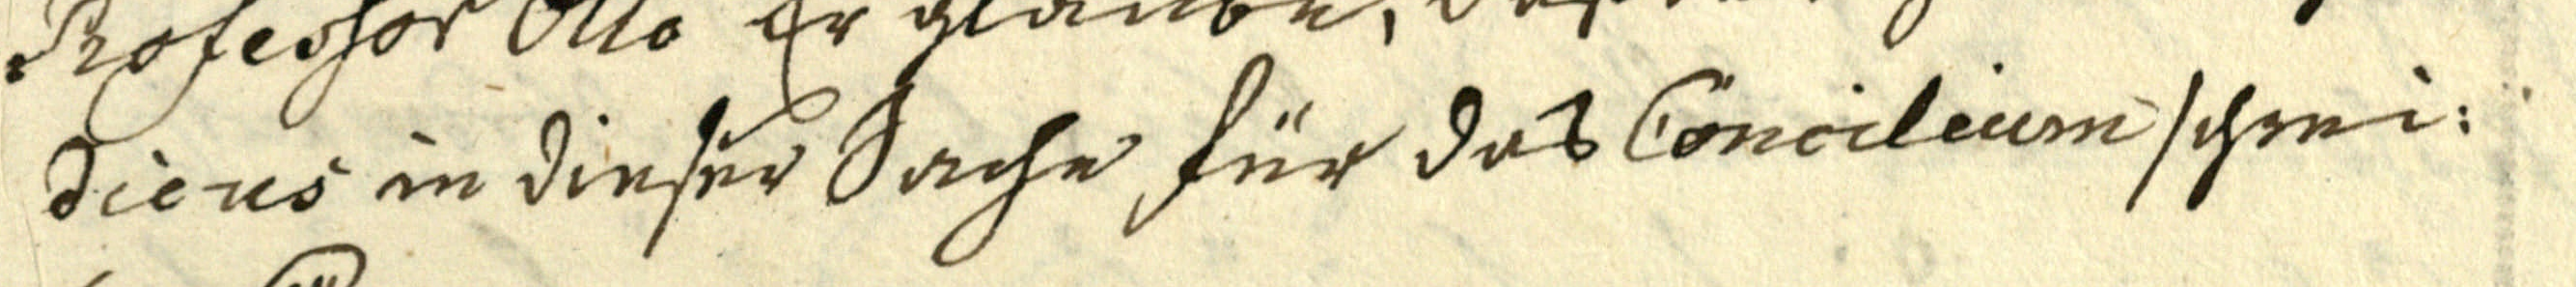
dicus in dieser Sache für das Concilium schrei¬
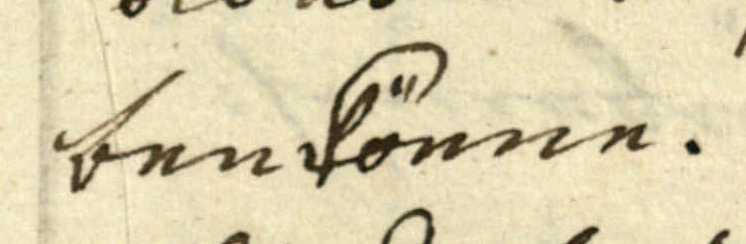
ben könne.
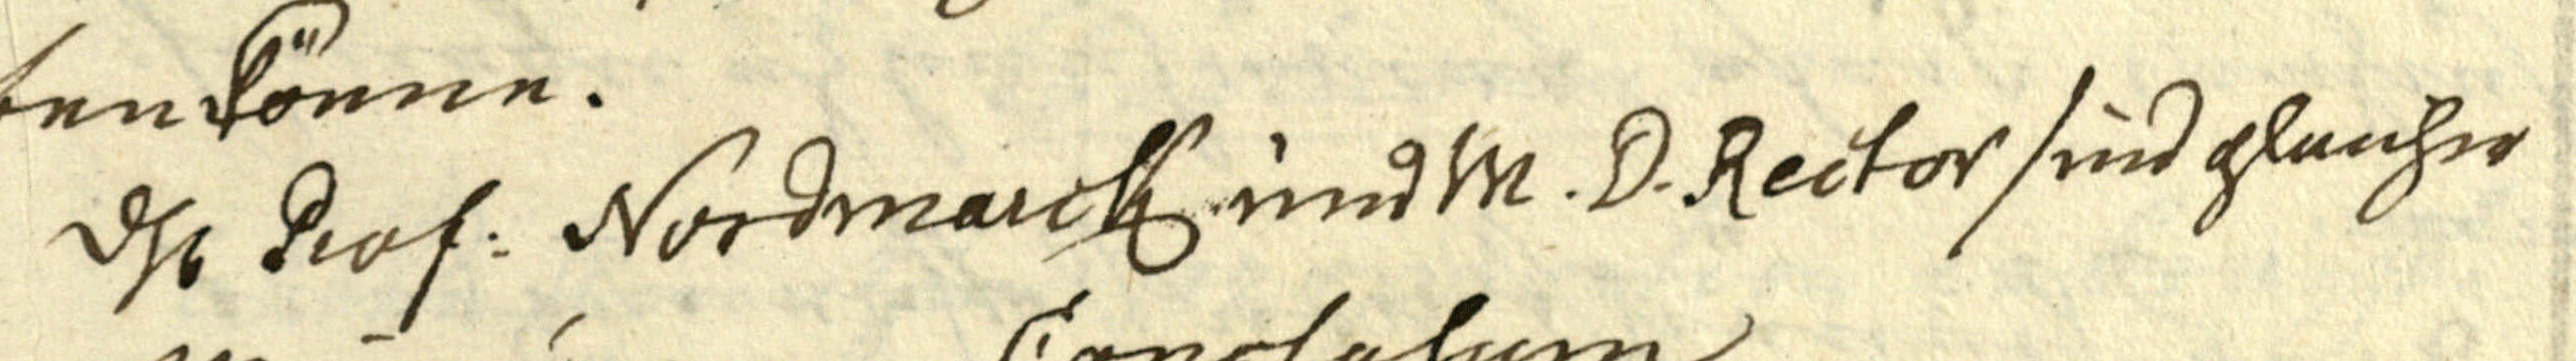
dh Prof. Nordmarck und M. D. Rector sind gleicher
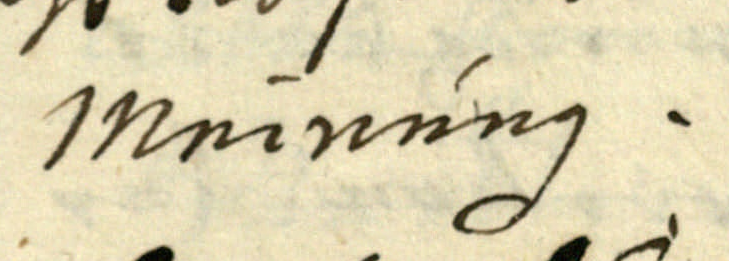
Meinung.
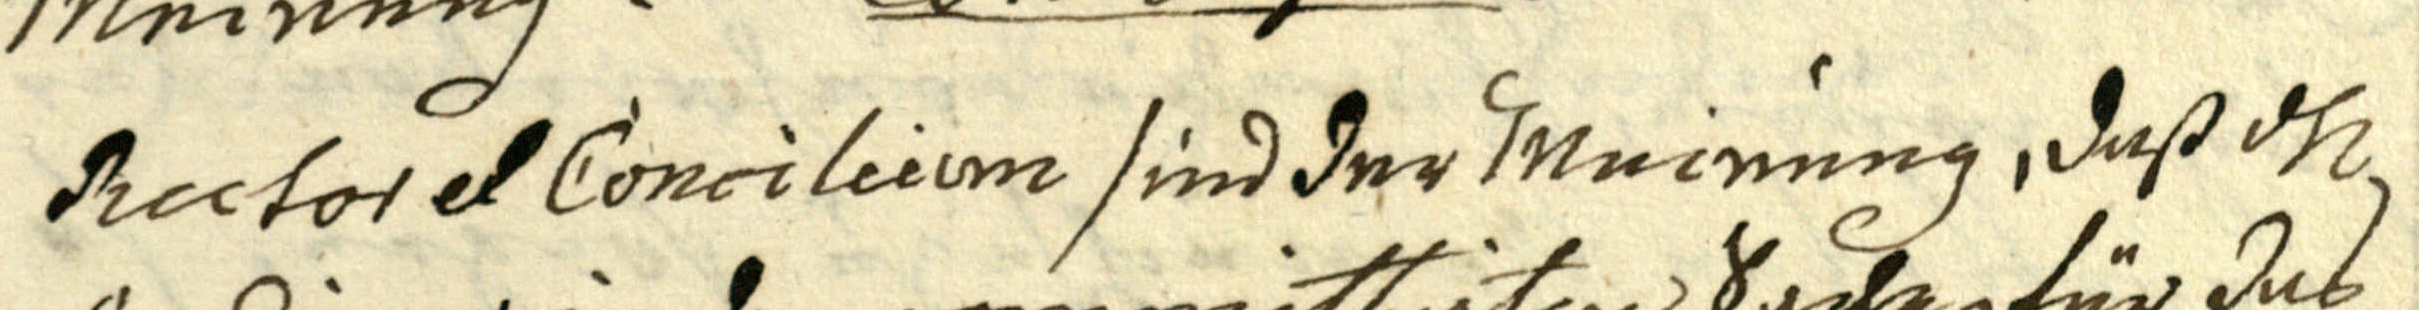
Rector et Concilium sind der Meinung, daß dh
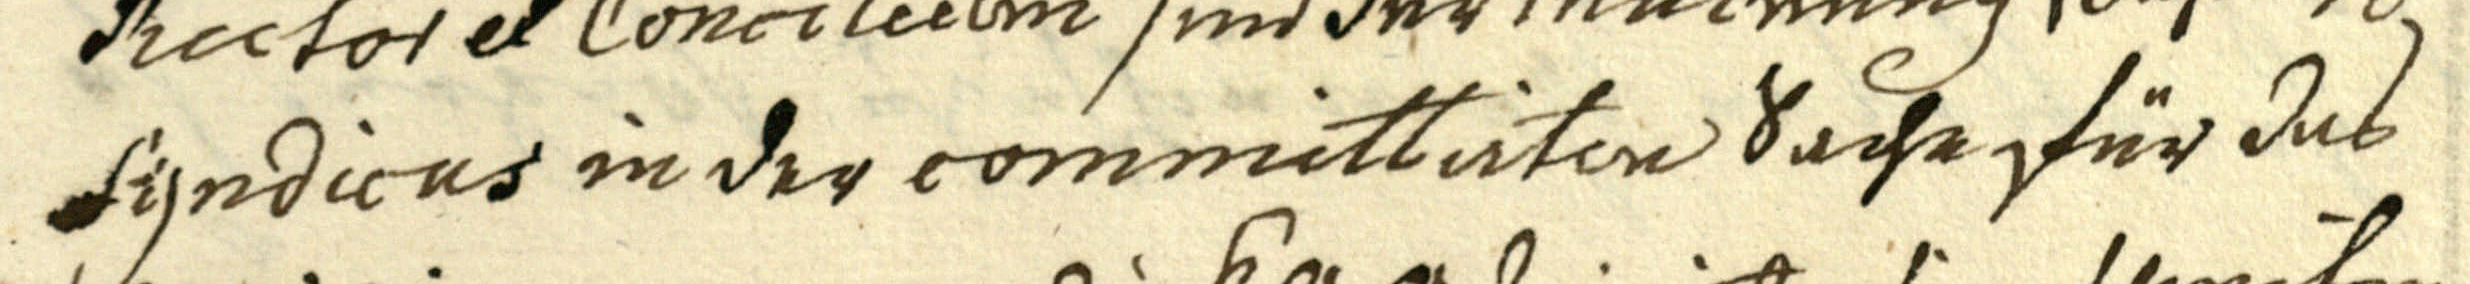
Sÿndicus in der committirten Sache für das
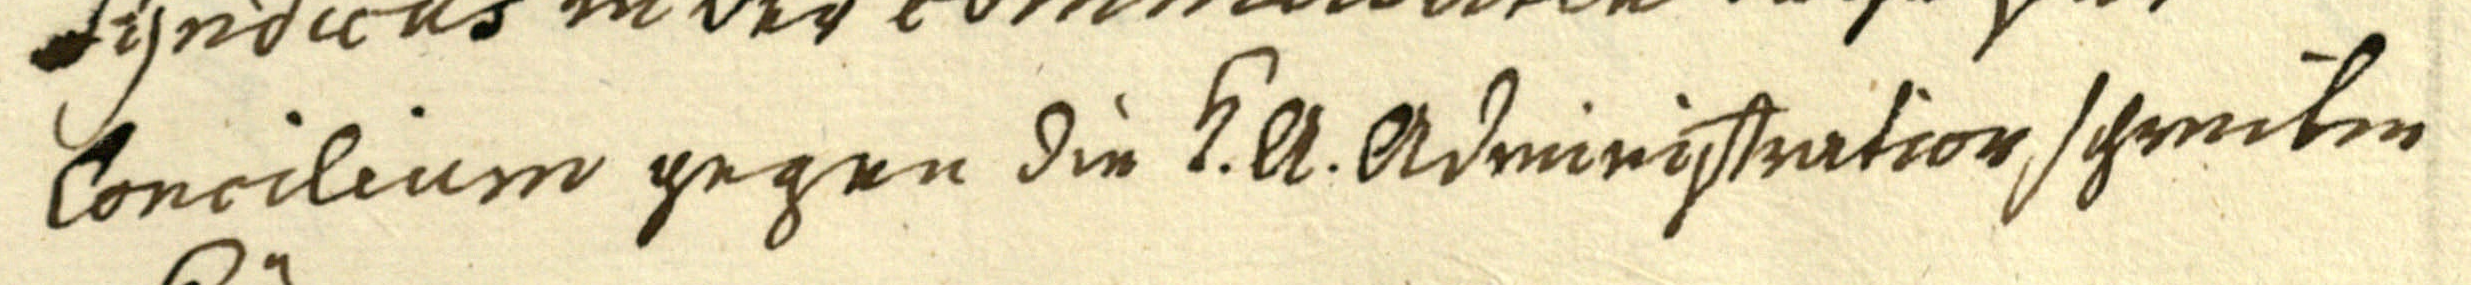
Concilium gegen die K. A. Administration schreiben
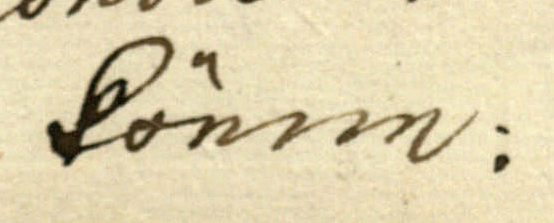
könne.
